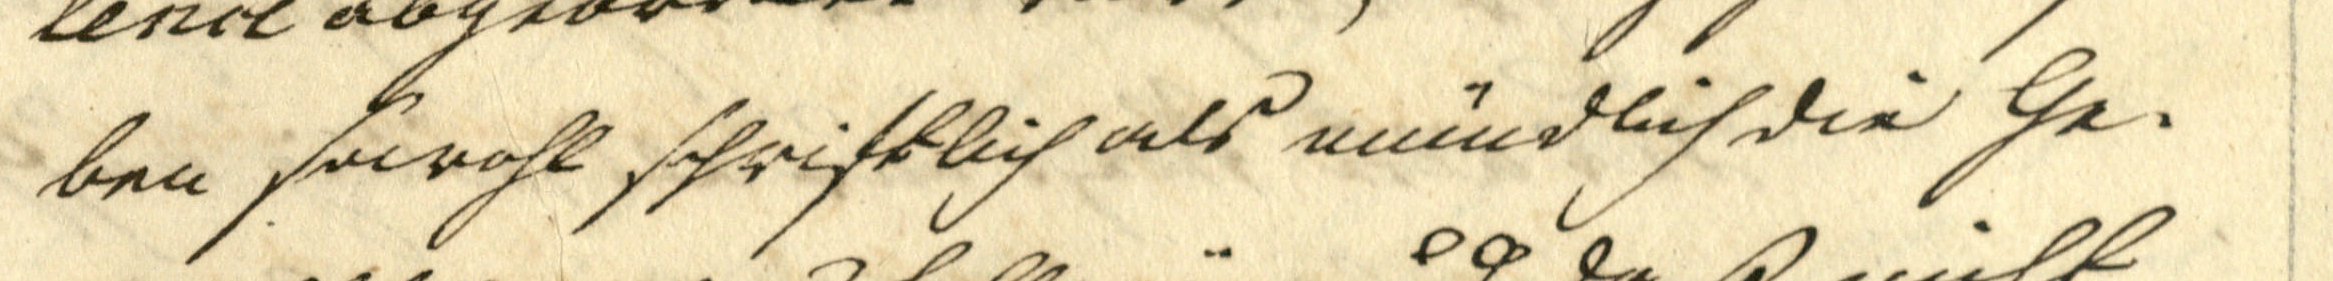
ben sowohl schriftlich als mündlich die Ge¬
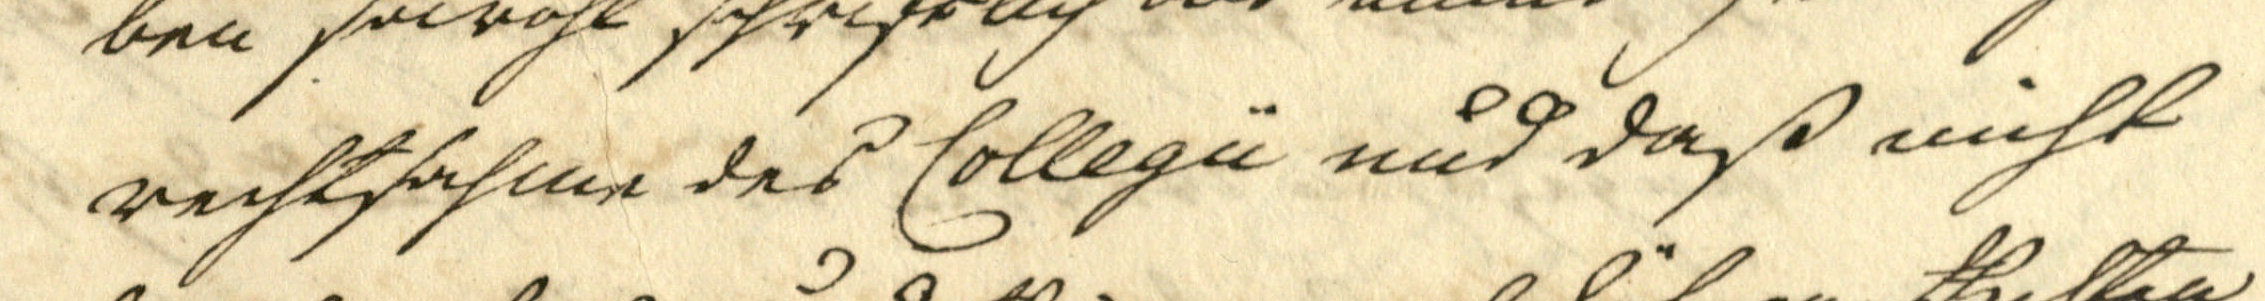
rechtsahme des Collegii und daß nicht
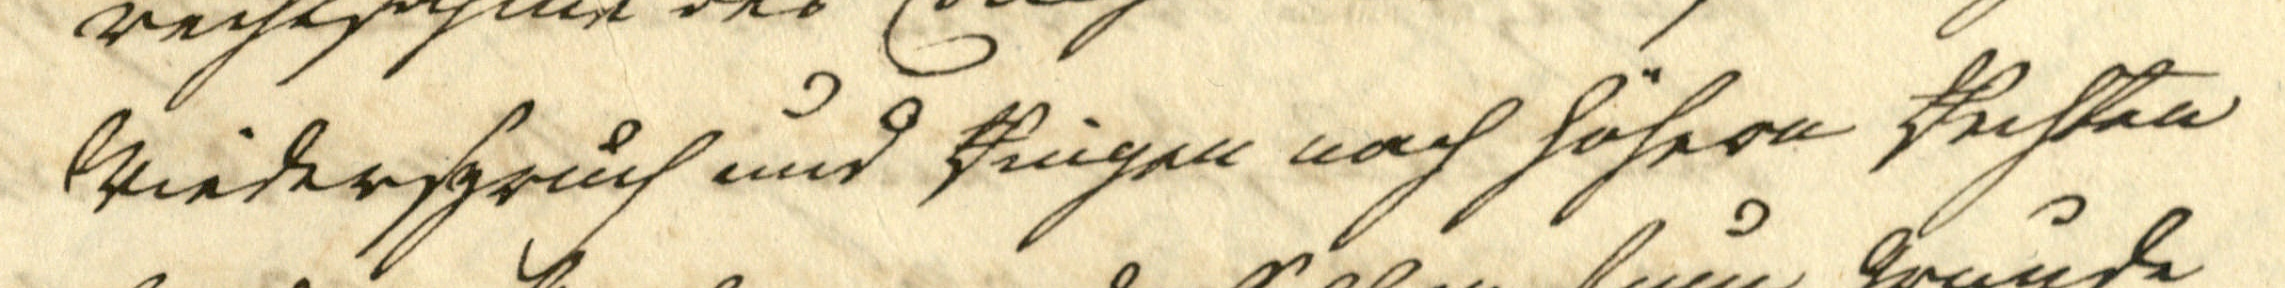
Wiederspruch und Ringen nach höhern Rechten
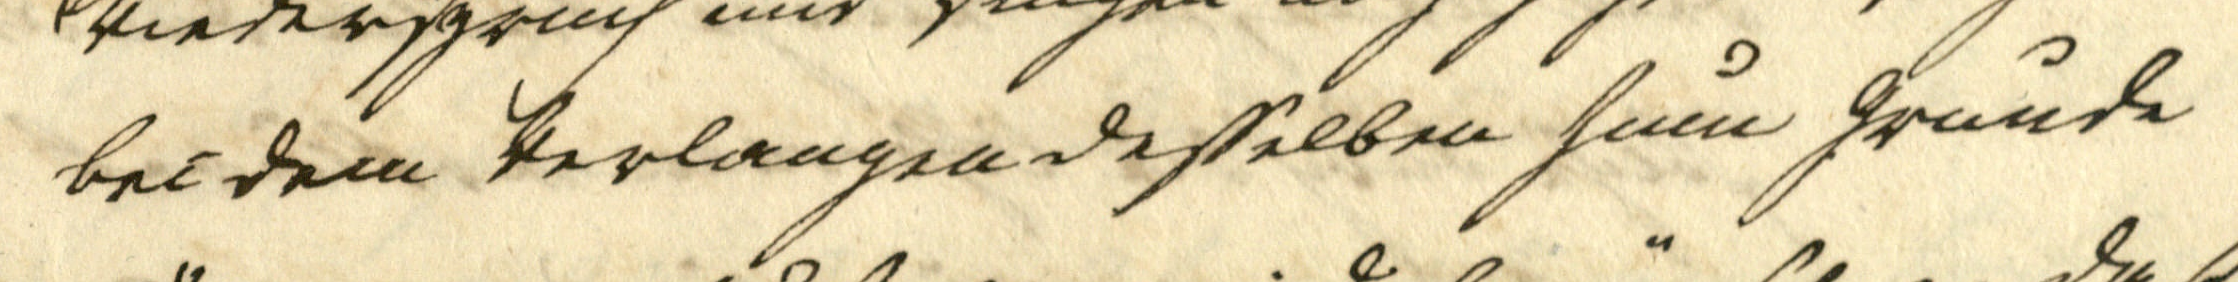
bei dem Verlangen desselben zum Grunde
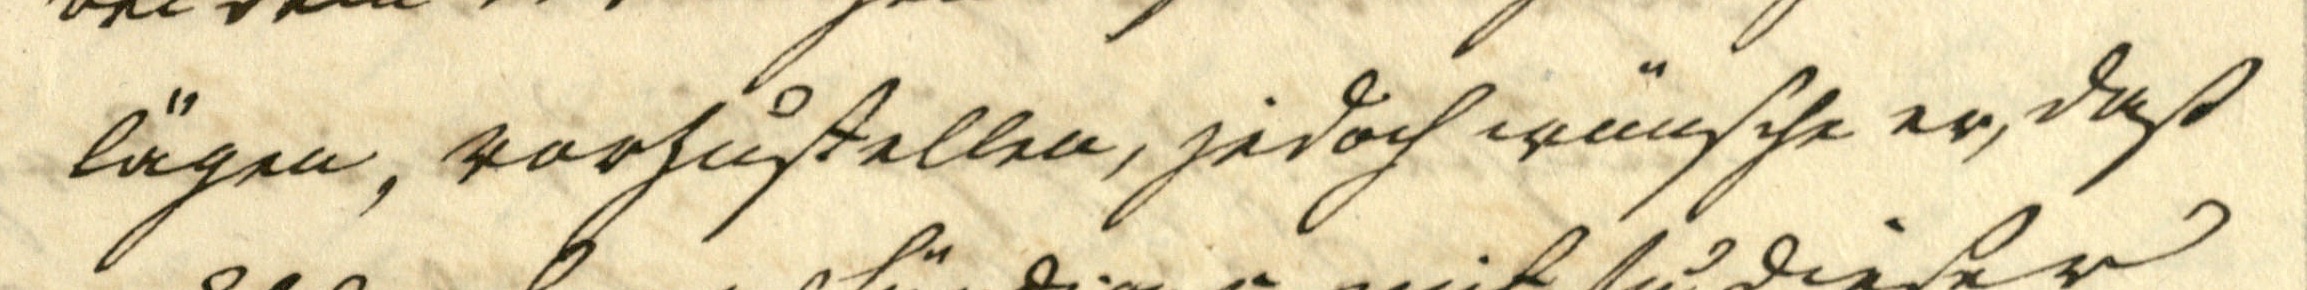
lägen, vorzustellen, jedoch wünsche er, daß
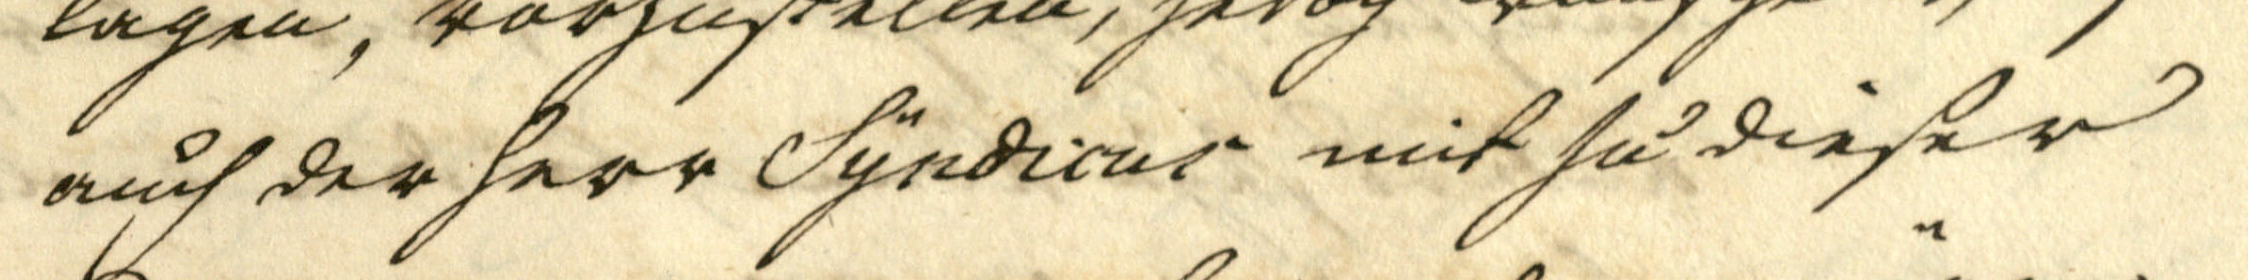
auch der Herr Sÿndicus mit zu dieser
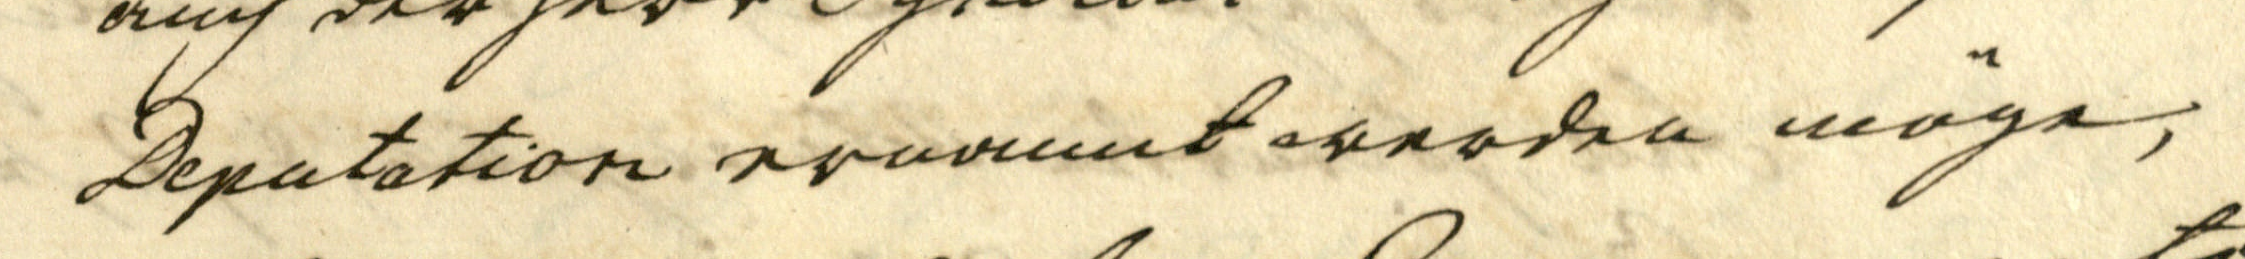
Deputation ernannt werden möge,
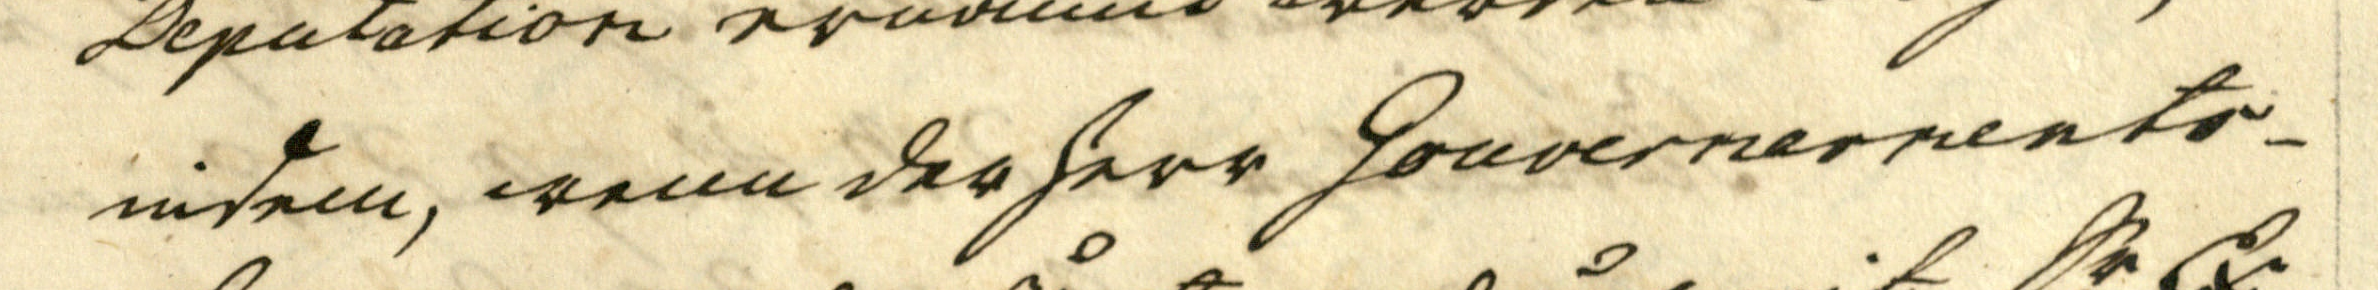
indem, wenn der Herr Gouvernements¬
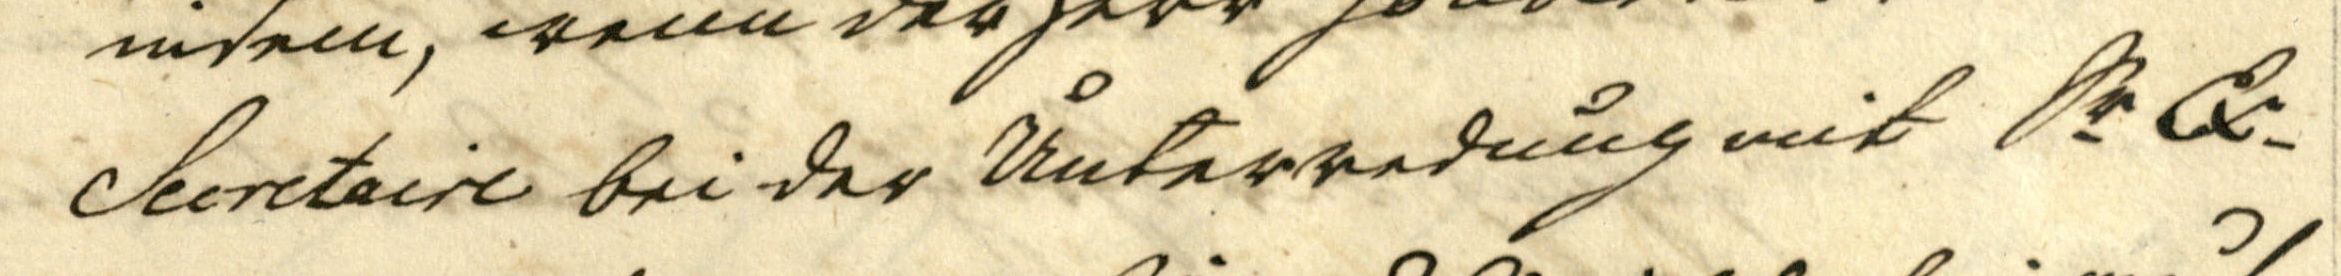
Secretaire bei der Unterredung mit Sr Ex¬
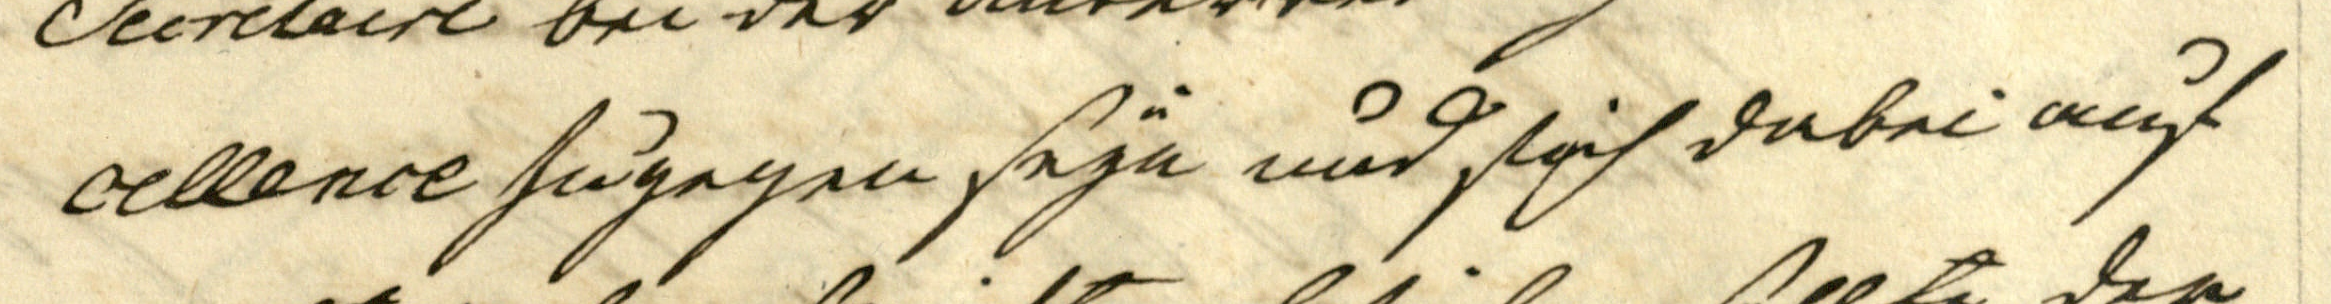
cellence zugegen seÿn und sich dabei auf
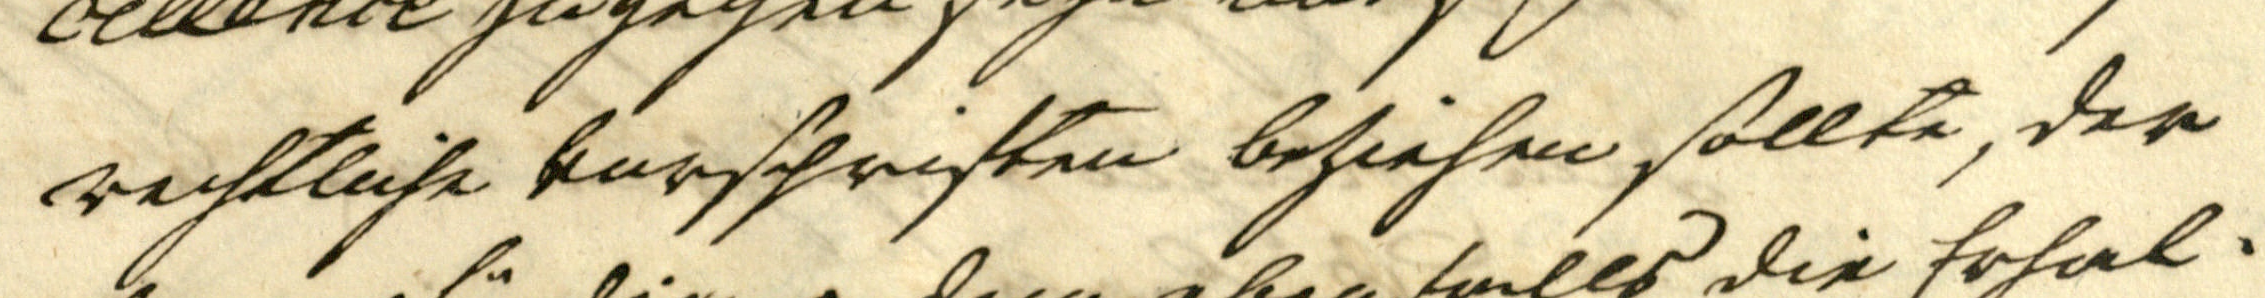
rechtliche Vorschriften beziehen sollte, der
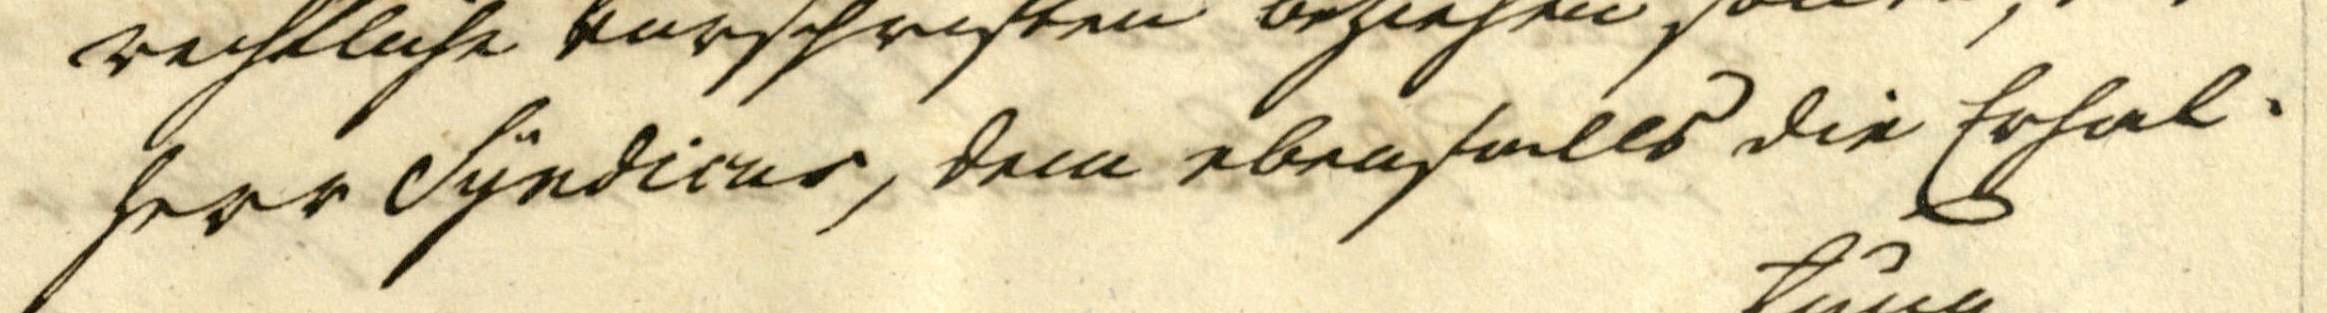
Herr Sÿndicus, dem ebenfalls die Erhal-
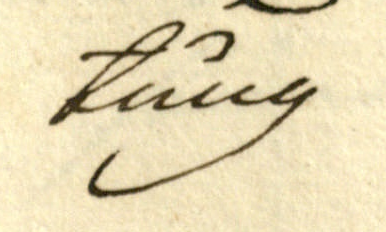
tung
